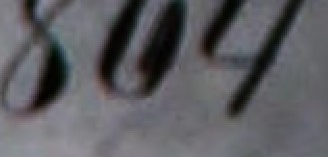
684
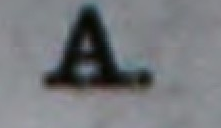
A.
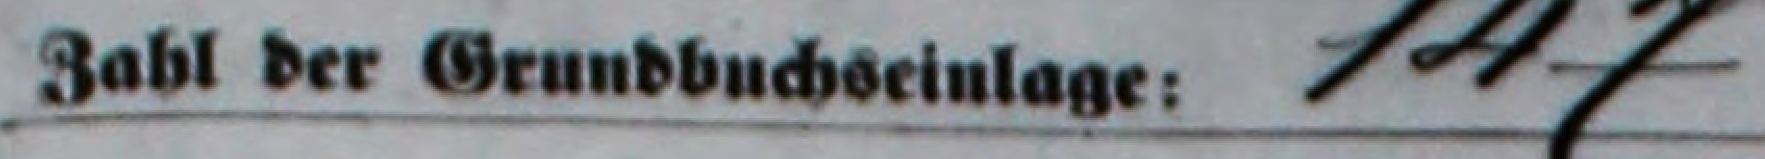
Zahl der Grundbuchseinlage: 147
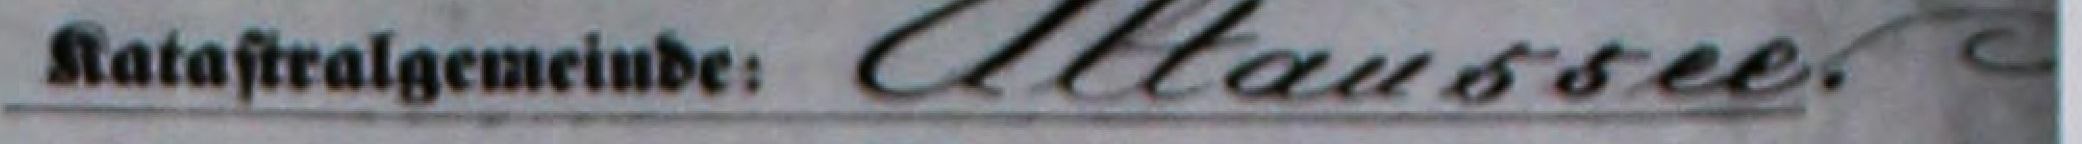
Katastralgemeinde: Altaussee. c
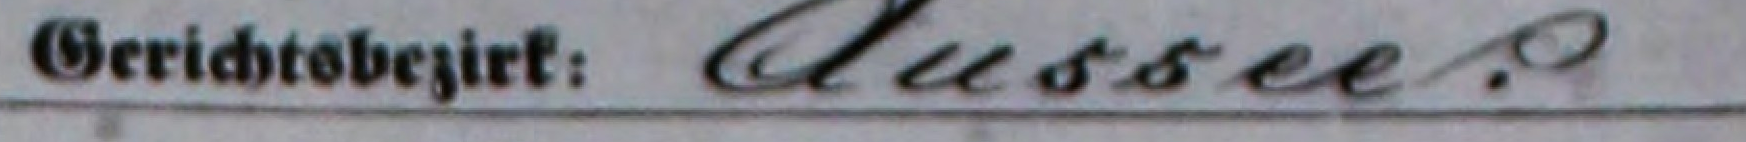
Gerichtsbezirk: Aussee. ?
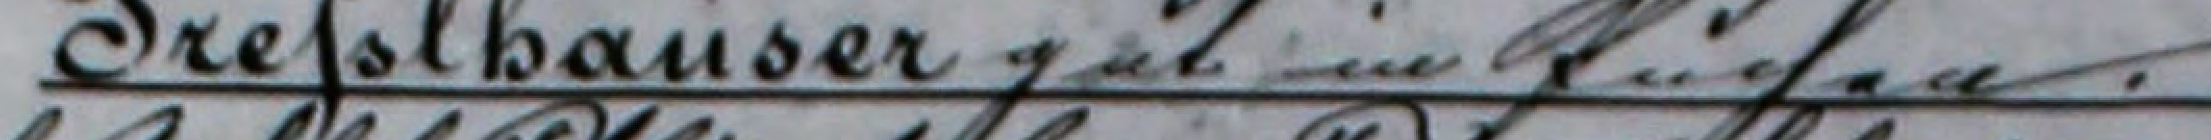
Presslhauser gut in Puchen.
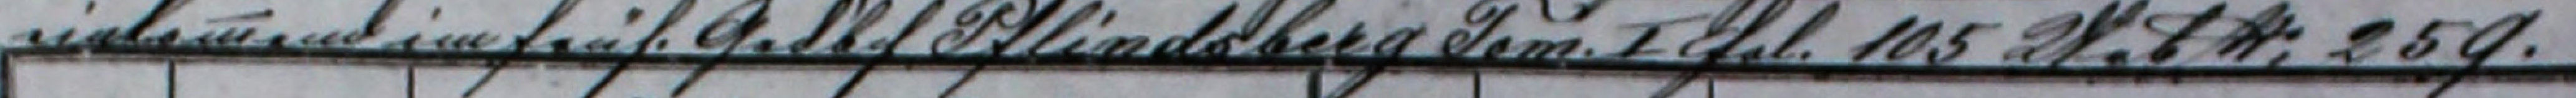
einkommend im fünf. Gedbch. Pflindsberg Tom. I Hal. 105 Urb No 259.
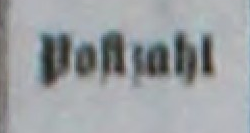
Postzahl
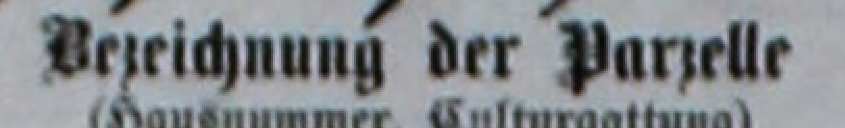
Bezeichnung der Parzelle
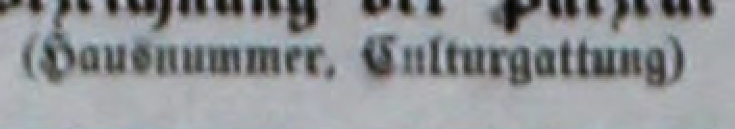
(Hausnummer, Culturgattung)
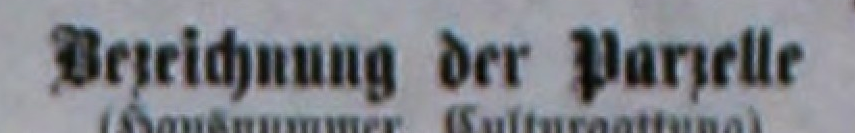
Bezeichnung der Parzelle
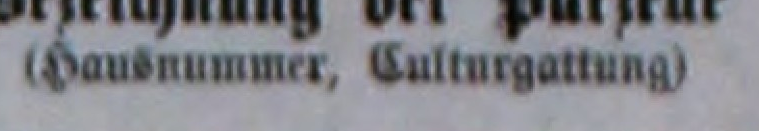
(Hausnummer, Culturgattung)
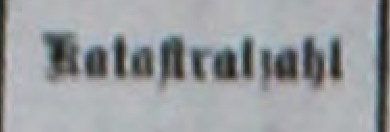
Katastralzahl
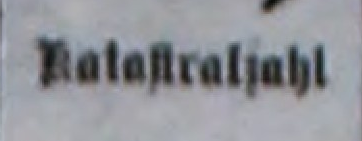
Katastralzahl
